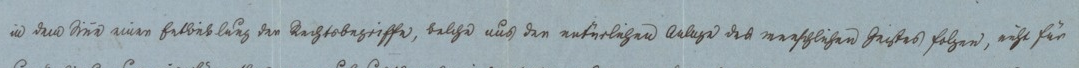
in dem Sinne einer Entwicklung der Rechtsbegriffe, welche aus der natürlichen Anlage des menschlichen Geistes folgen, nicht für
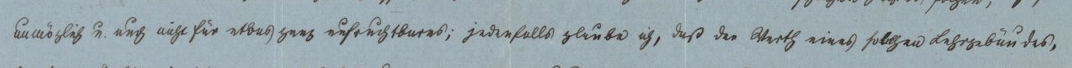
unmöglich u. auch nicht für etwas ganz unfruchtbares; jedenfalls glaube ich, daß der Werth eines solchen Lehrgebäudes,
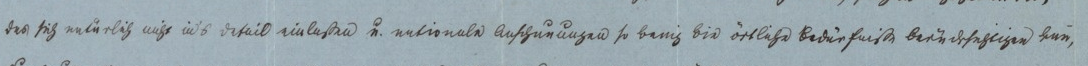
das sich natürlich nicht in's Detail einlassen u. nationale Anschauungen so wenig wie örtliche Bedürfnisse berücksichtigen kann,
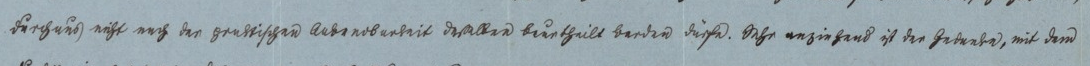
durchaus nicht nach der praktischen Anwendbarkeit desselben beurtheilt werden dürfe. Sehr anziehend ist der Gedanke, mit dem
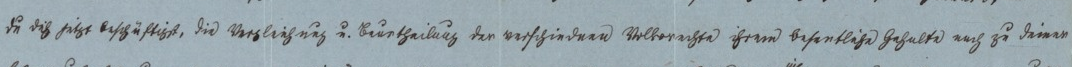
du dich jetzt beschäftigst, die Vergleichung u. Beurtheilung der verschiednen Volksrechte ihrem wesentliche Gehalte nach zu deiner
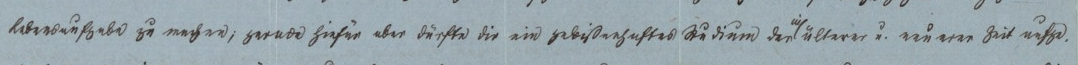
Lebensaufgabe zu machen; gerade hiefür aber dürfte dir ein gewissenhaftes Studium der in älterer u. neuerer Zeit aufge-
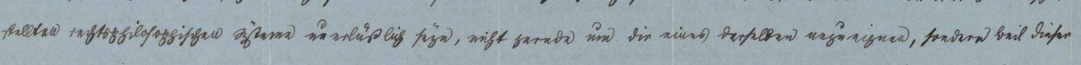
stellten rechtsphilosophischen Systeme unerläßlich seyn, nicht gerade um dir eines derselben anzueignen, sondern weil dieser
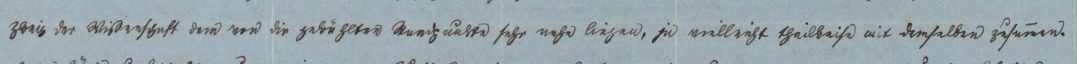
Zweig der Wissenschaft dem von dir gewählten Standpunkte sehr nahe liegen, ja vielleicht theilweise mit demselben zusammen-
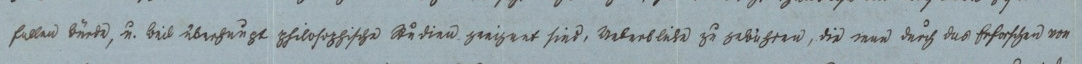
fallen würde, u. weil überhaupt philosophische Studien geeignet sind, Ueberblicke zu gewähren, die man durch das Erforschen von
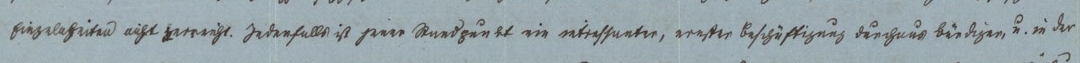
Einzelheiten nicht erreicht. Jedenfalls ist jener Standpunkt ein intressanter, ernster Beschäftigung durchaus würdiger, u. in der
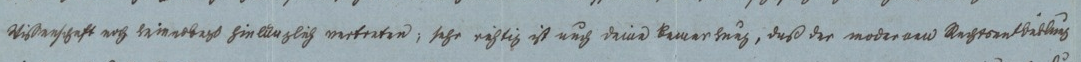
Wissenschaft noch keineswegs hinlänglich vertreten; sehr richtig ist auch deine Bemerkung, daß der modernen Rechtsentwicklung
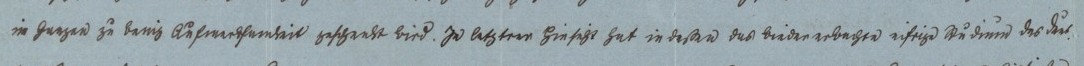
im ganzen zu wenig Aufmerksamkeit geschenkt wird. In letztrer Hinsicht hat indessen das wiedererwachte eifrige Studium des deut-
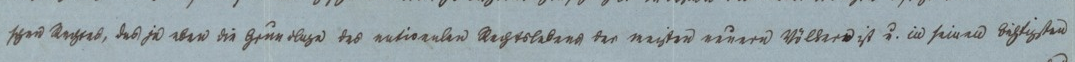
schen Rechtes, das ja eben die Grundlage des nationalen Rechtslebens der meisten neuern Völker ist u. in seinen wichtigsten
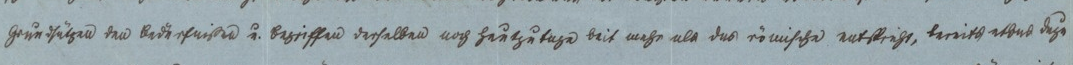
Grundsätzen den Bedürfnissen u. Begriffen derselben noch heutzutage weit mehr als das römische entspricht, bereits etwas dazu
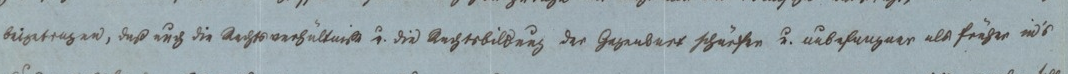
beigetragen, daß auch die Rechtsverhältnisse u. die Rechtsbildung der Gegenwart schärfer u. unbefangner als früher in's
